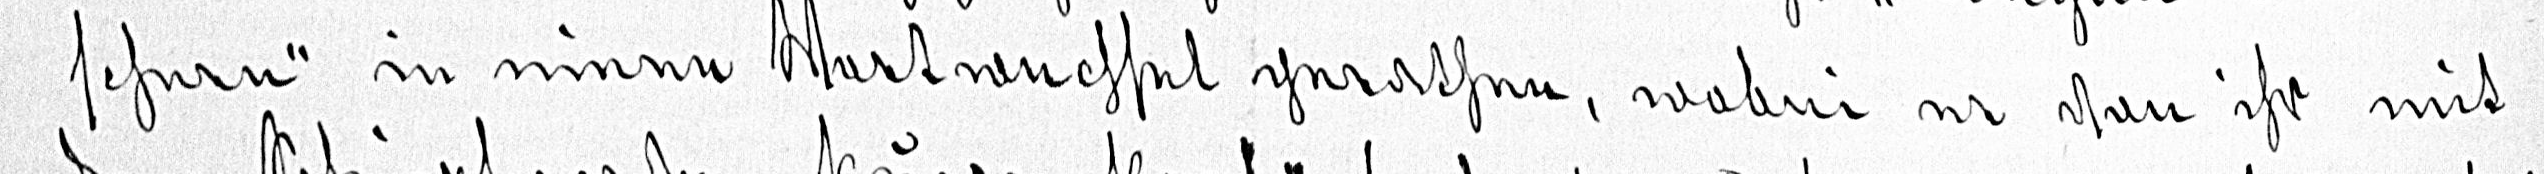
schnen" in einen Wartwechsel gerathen, wobei er von ihr mit
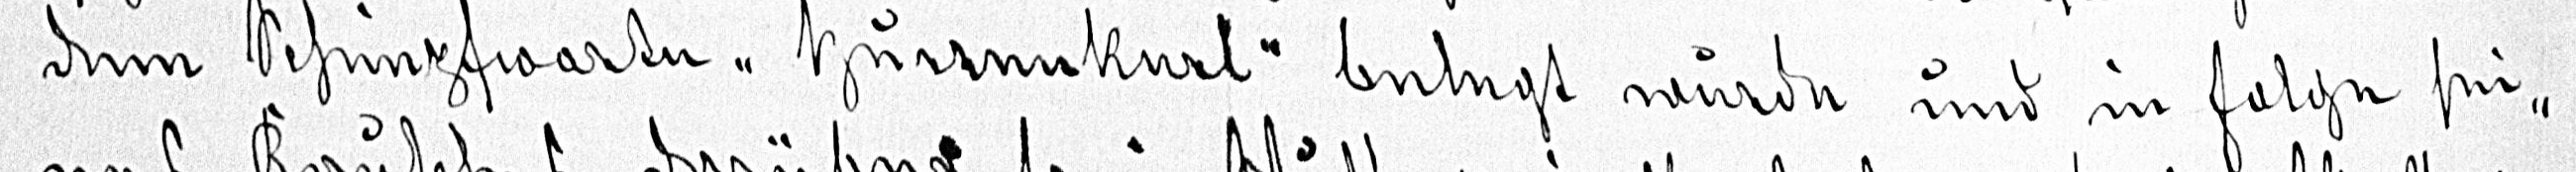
dem Schimpfwarte "Hurrenkarl" belegt wurde und in Folge sei¬
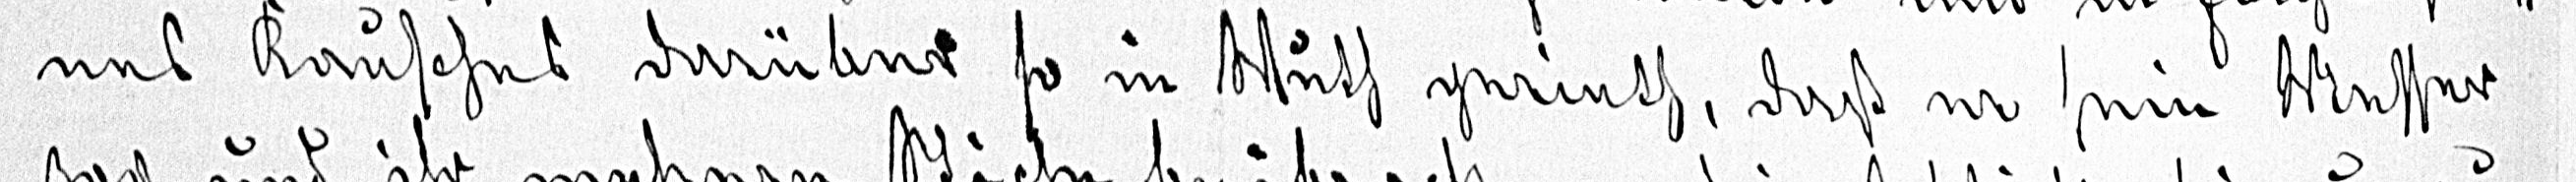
nes Rausches darüber so in Wuth gerieth, daß er sein Messer
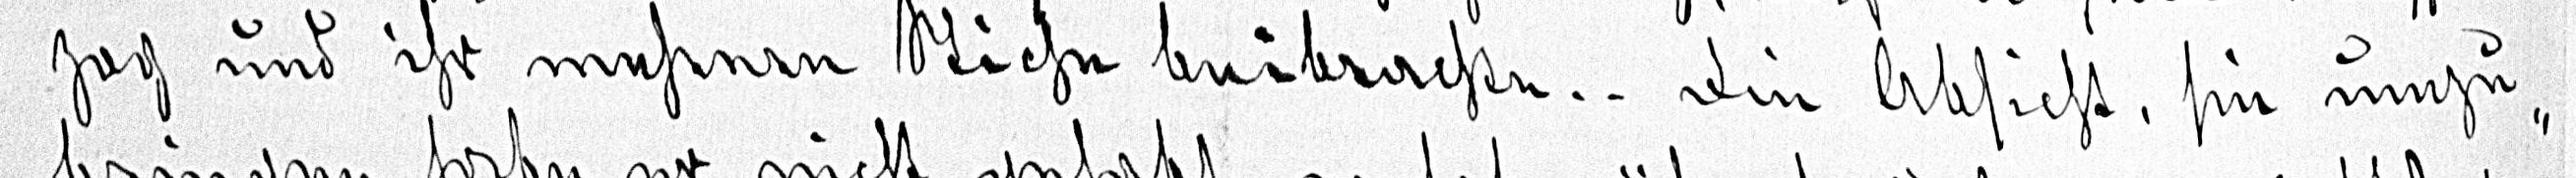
zog und ihr mehrere Stiche beibrachte. Die Absicht, sie umzu¬
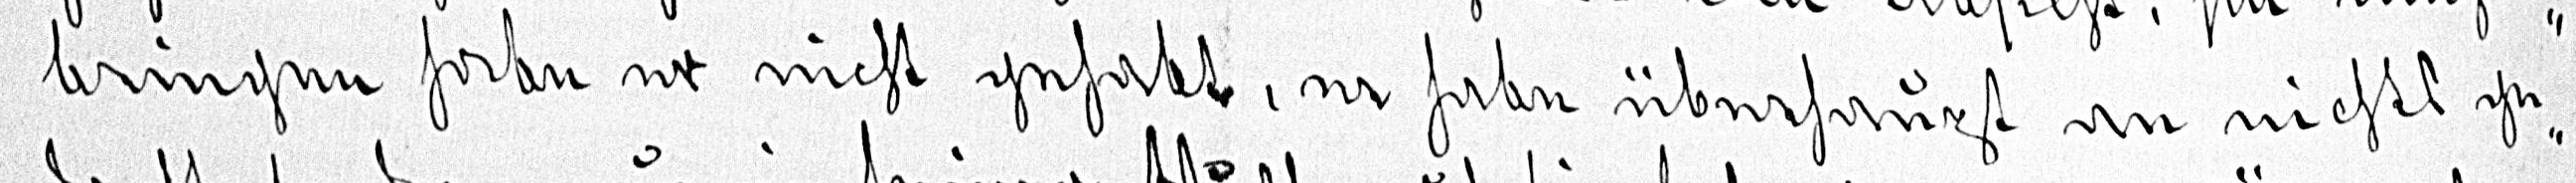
bringen habe er nicht gehabt, er habe überhaupt an nichts ge¬
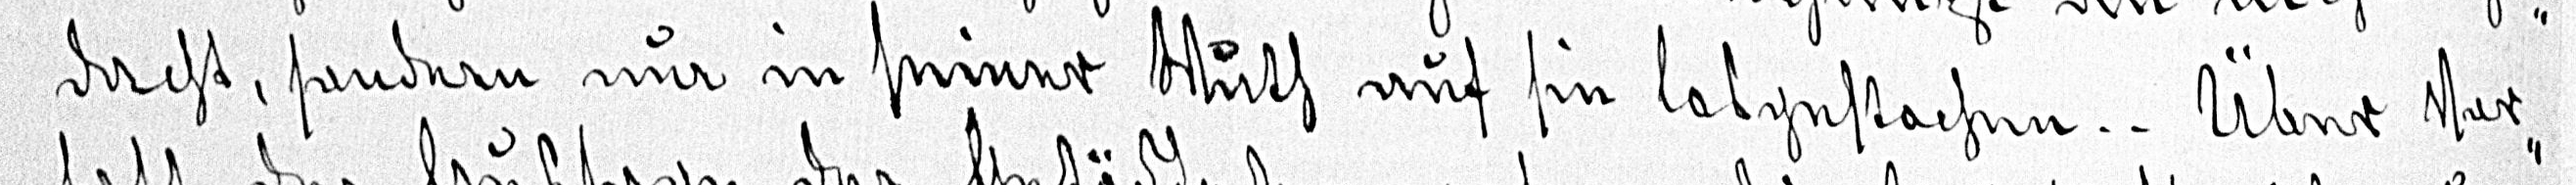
dacht, sondern nur in seiner Wuth auf sie losgestochen. - Über Ver¬
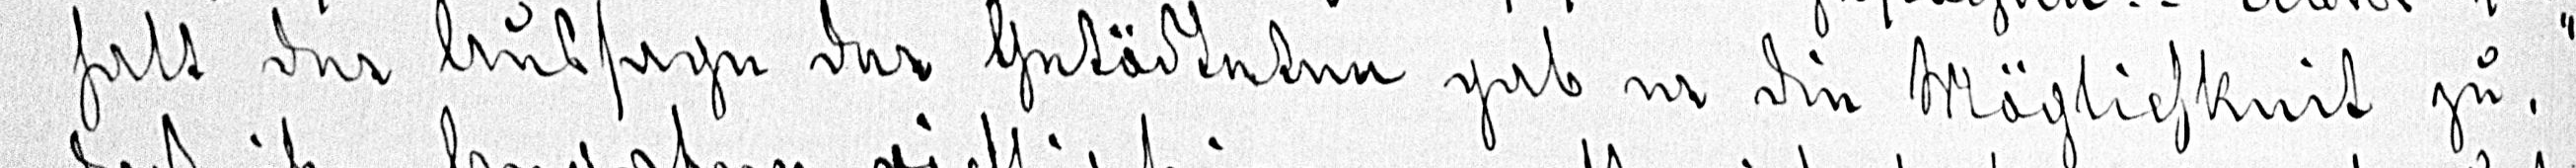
halt der Aussage der Getödteten gab er die Möglichkeit zu
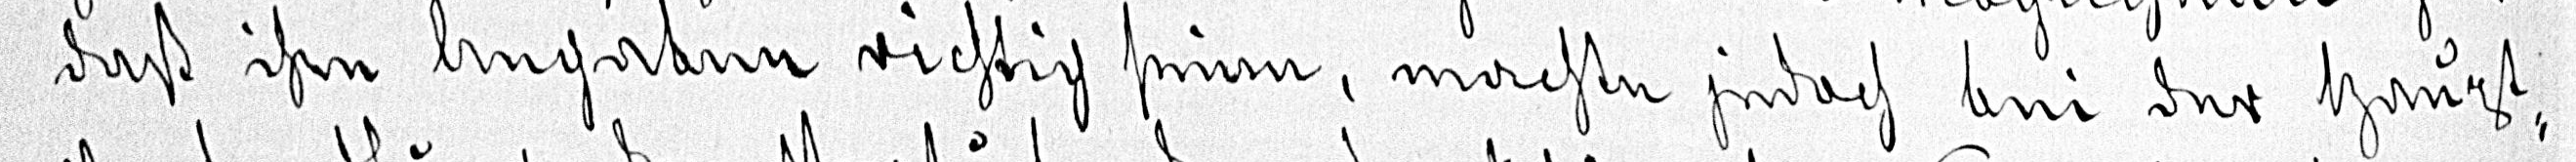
daß ihre Angaben richtig seine, machte jedoch bei der Haupt¬
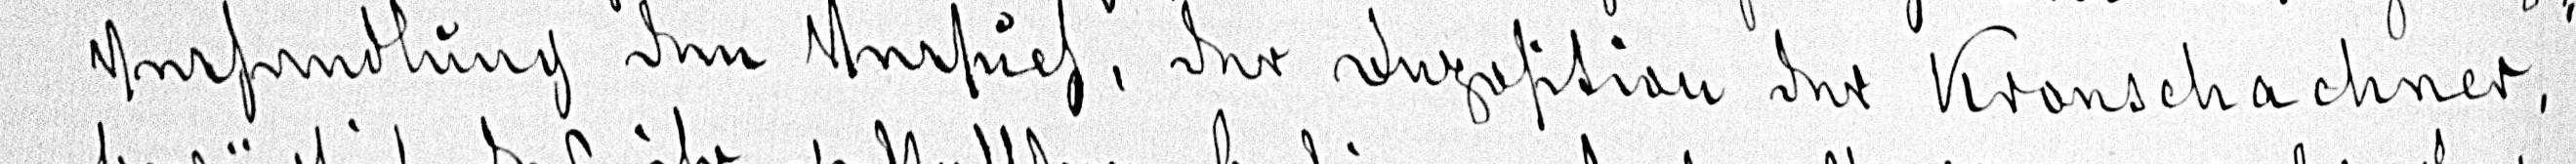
verhandlung den Versuch, der Deposition der Kronschachner,
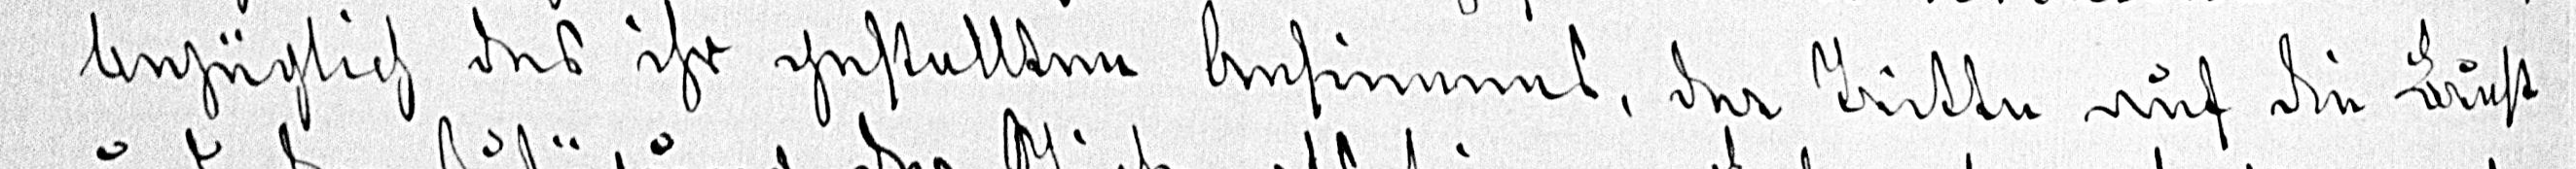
bezüglich des ihr gestellten Anxx, der Tritte auf die Brust
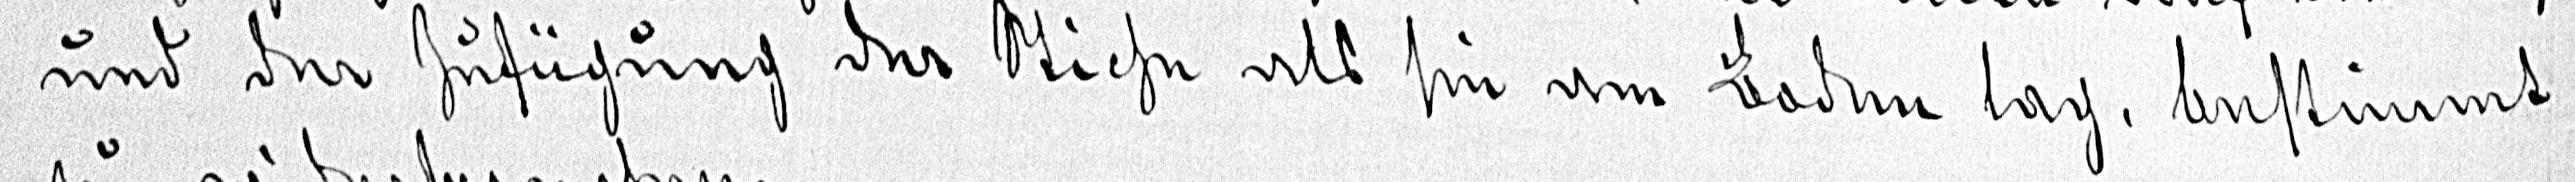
und der Zufügung der Stiche als sie am Boden lag, bestimmt
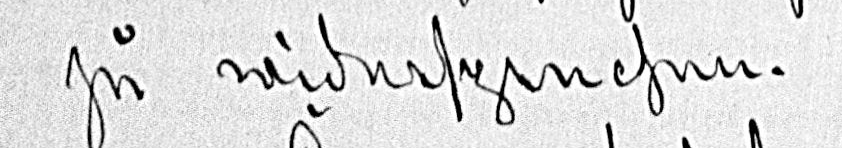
zu widersprechen.
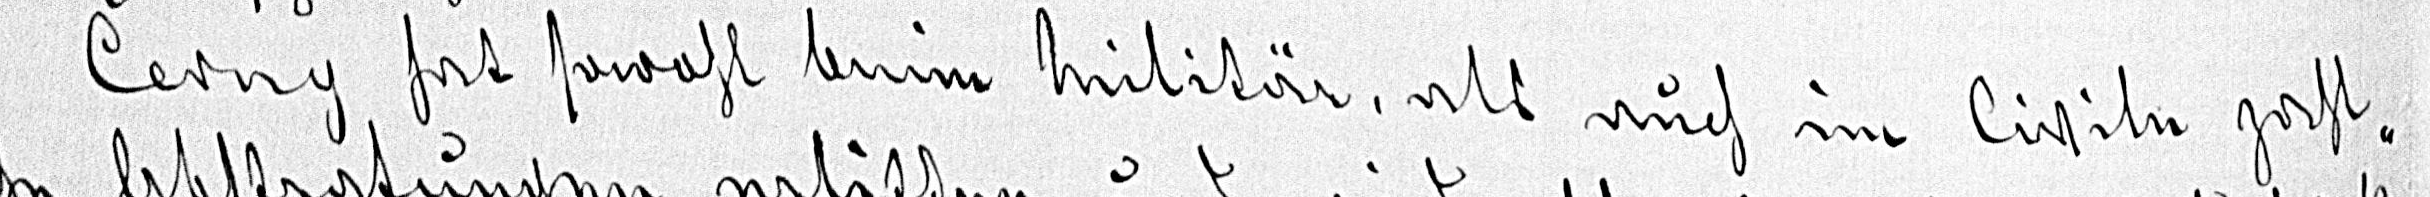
Černy hat sowohl beim Militär, als auch im Civile zahl¬
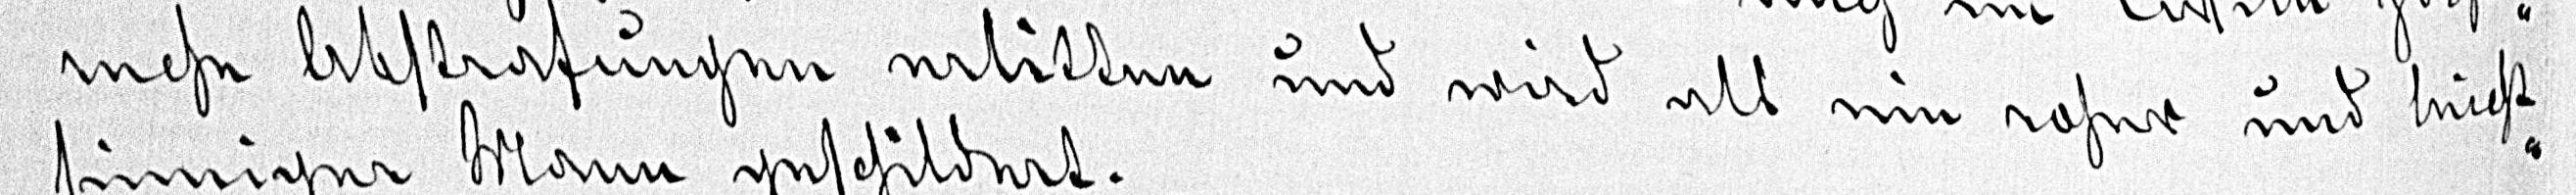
mehn Abstrafungen erlitten und wird als ein roher und leicht
